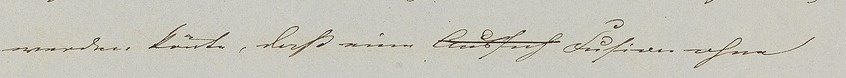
werden könnte, daß eine Aussich Fusion ohne
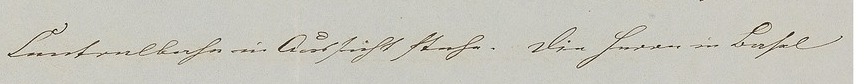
Centralbahn in Aussicht stehe. Die Herrn in Basel
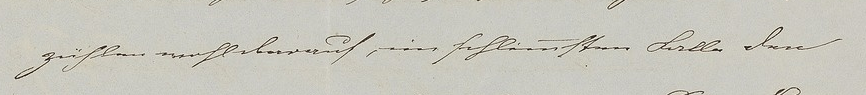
zählen wohl darauf, im schlimmsten Falle den
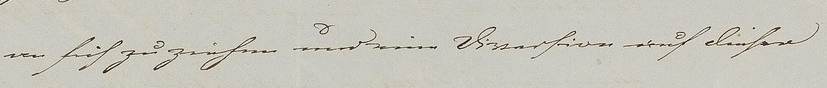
an sich zu ziehen und eine Diversion auf dieser
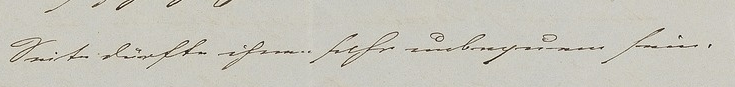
Seite dürfte ihnen sehr unbequem sein.
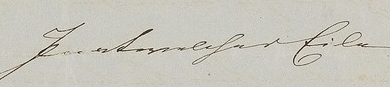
In etwelcher Eile
